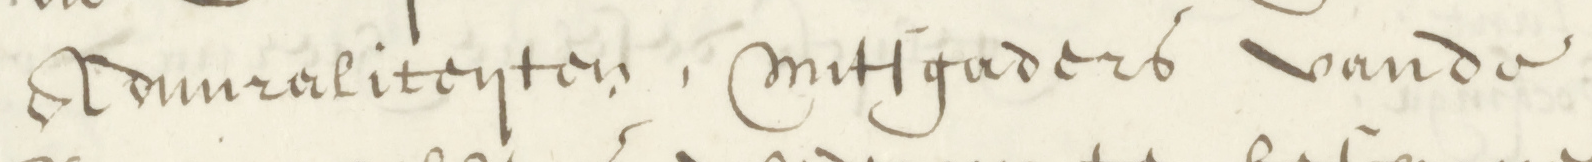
Admiraliteyten, mitsgaders vande
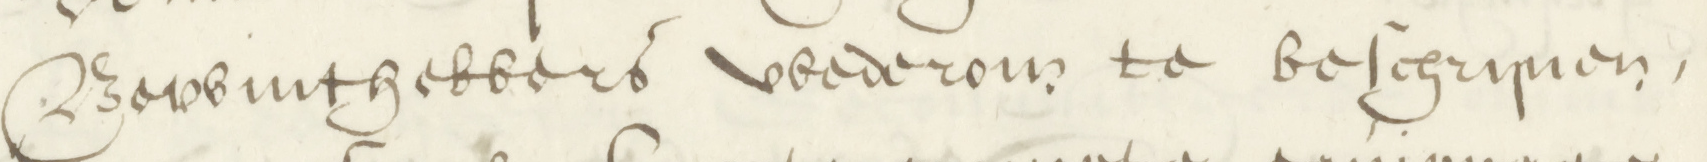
Bewinthebbers wederom te beschryuen,
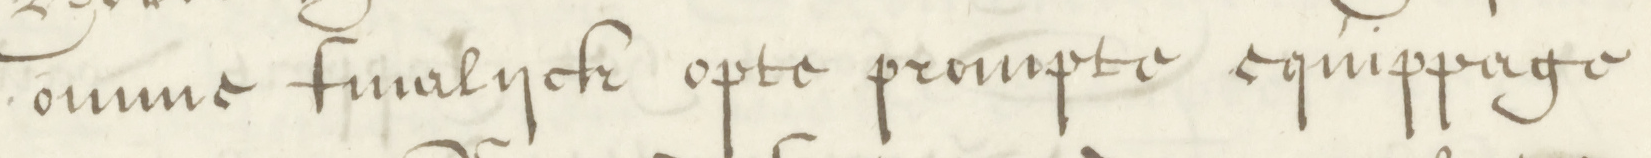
omme finalyck opte prompte equippage
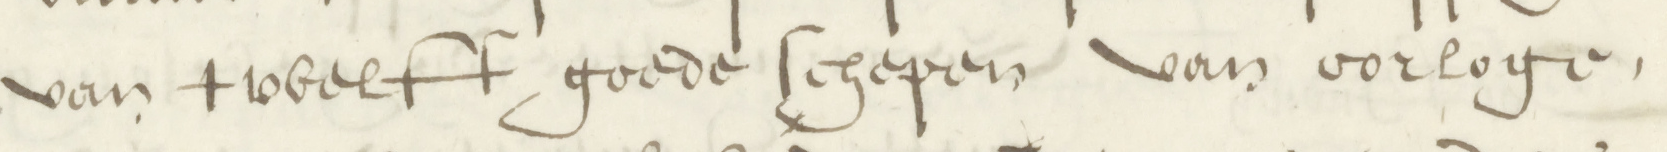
van twelff goede schepen van oorloge,
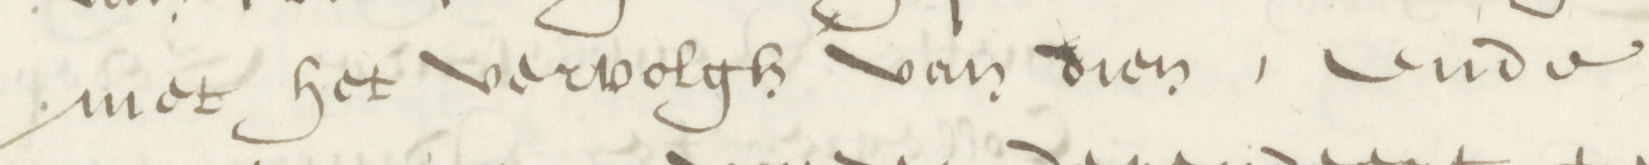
met het vervolgh van dien, ende
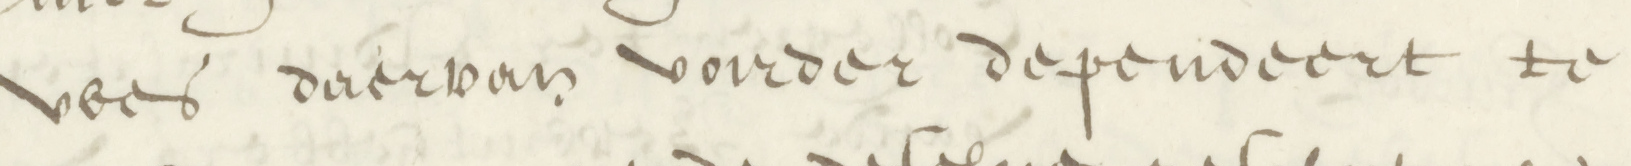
wes daervan voirder dependeert te
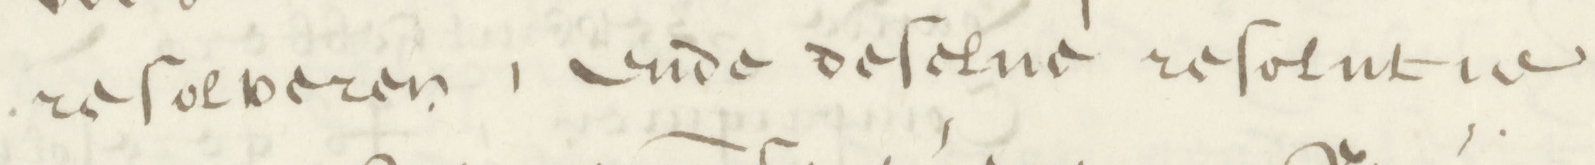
resolveren, ende deselue resolutie
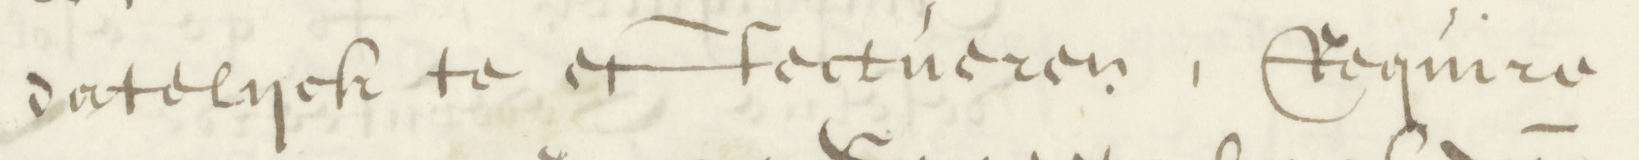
datelyck te effectueren. Require
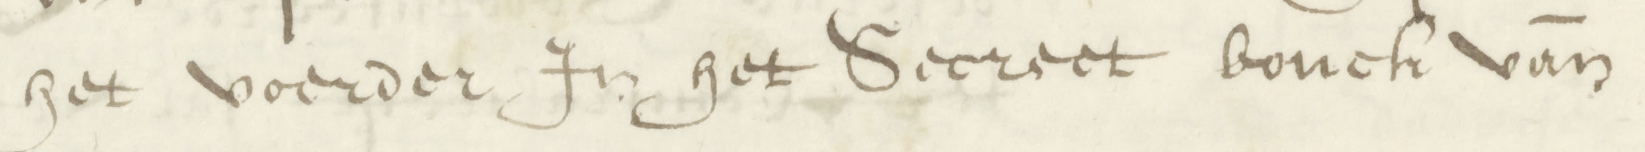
het voerder In het Secreet bouck van
